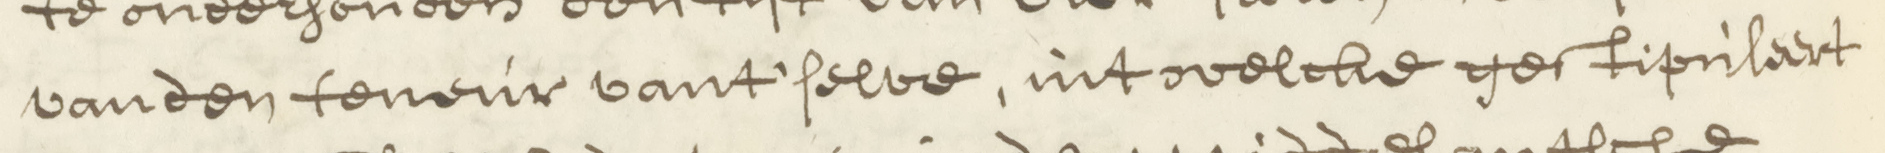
vanden teneur vant' selve, int welcke gestipuleert
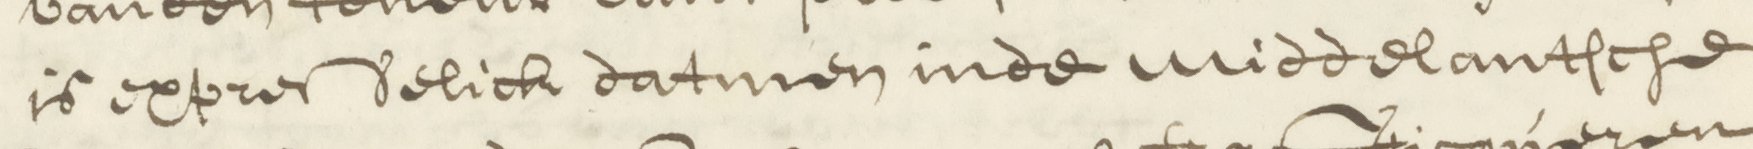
is expresselick datmen inde Middelantsche
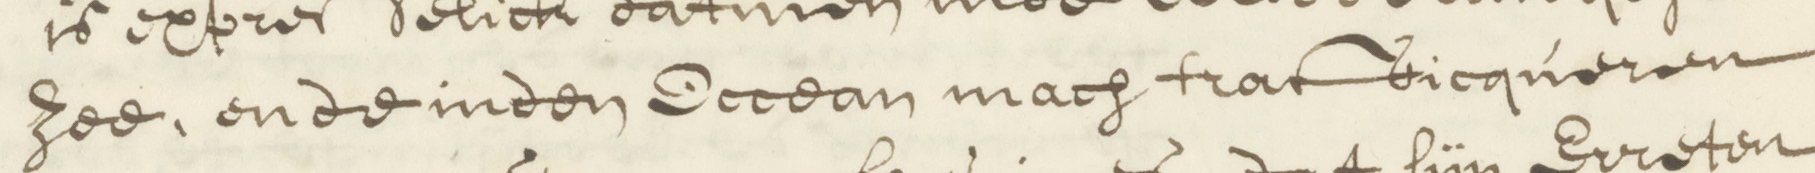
zee, ende inden Occean mach trafficqueren
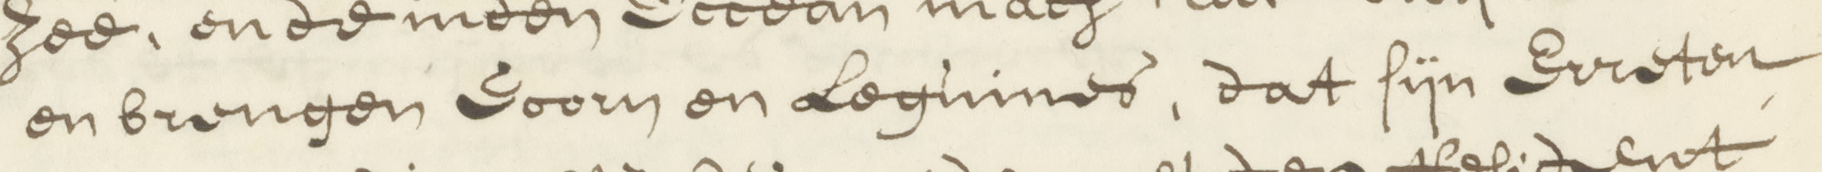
en brengen Coorn en Legumes, dat sijn Erreten
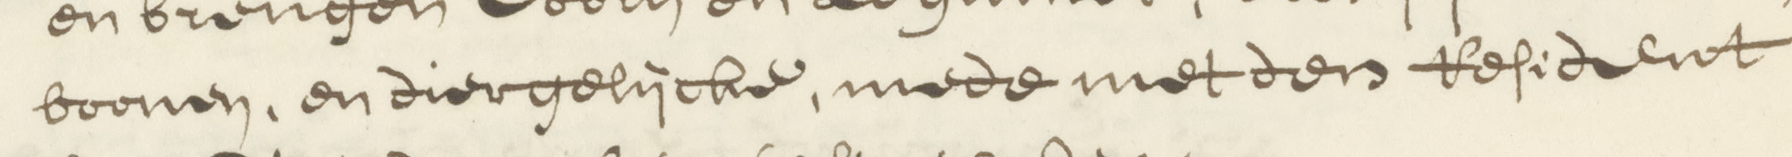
boonen, en diergelijcke, mede met den Resident
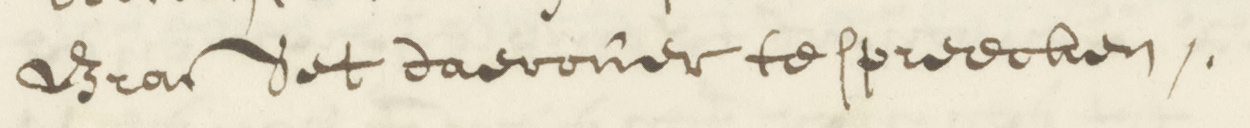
Brasset daerouer te spreecken.
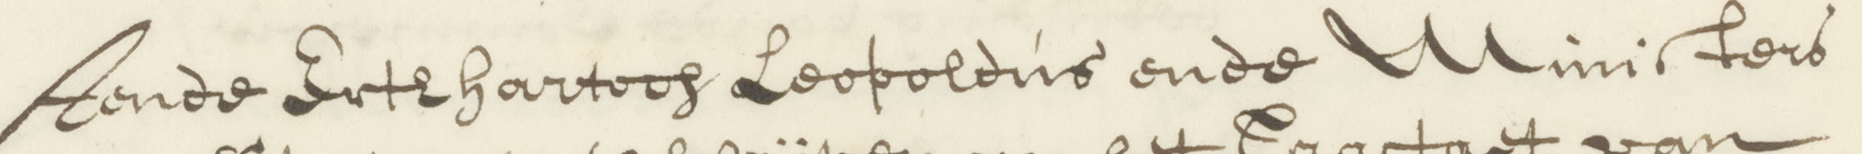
Aende Ertzhartoch Leopoldus ende Ministers
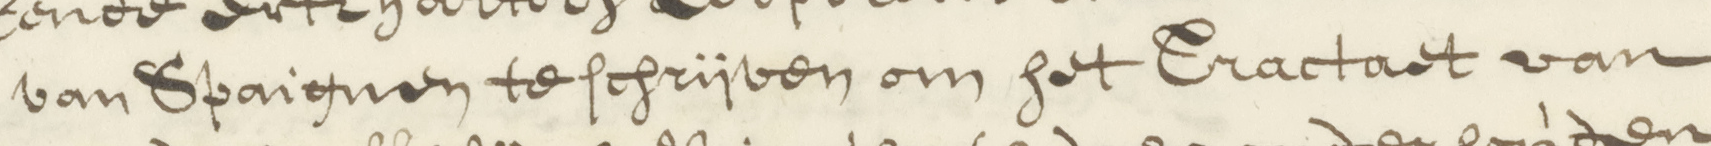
van Spaignen te schrijven om het Tractaet van
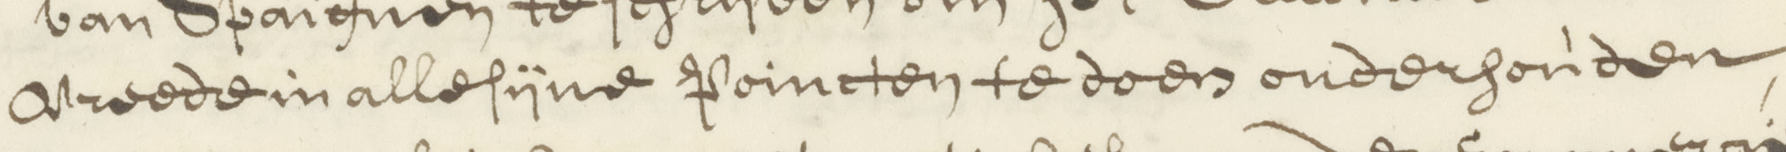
Vreede in alle sijne Poincten te doen onderhouden,
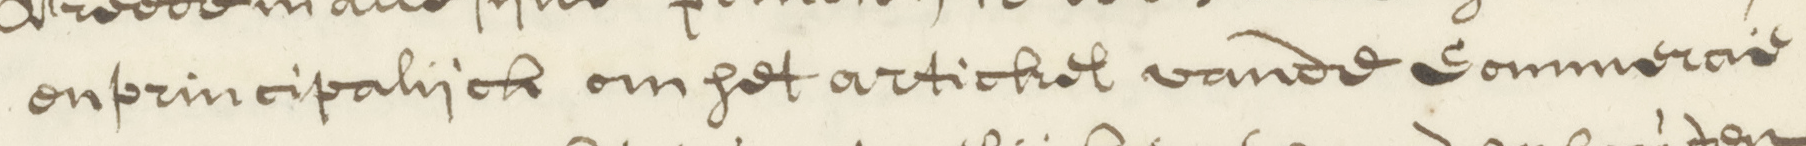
en principalijck om het artickel vande Commercie
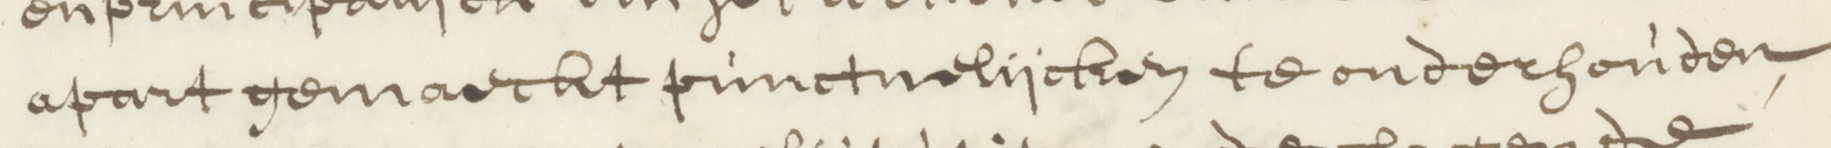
apart gemaeckt punctuelijcken te onderhouden
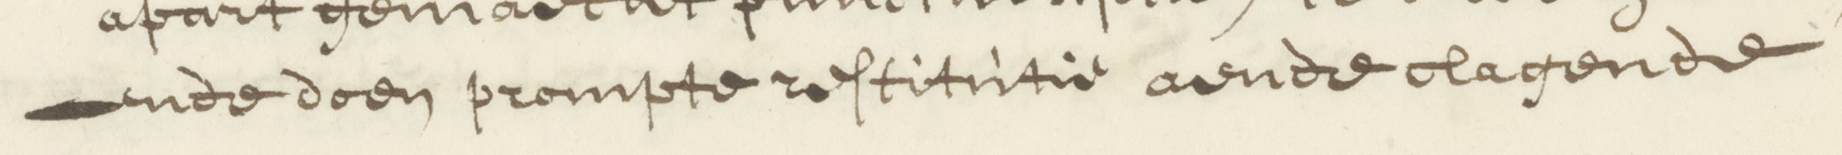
ende doen prompte restitutie aende clagende
